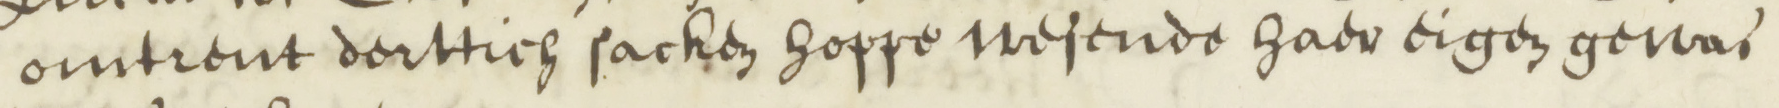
omtrent derttich sacken hoppe wesende haer eigen gewas
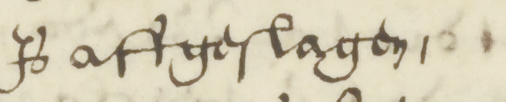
is affgeslagen.
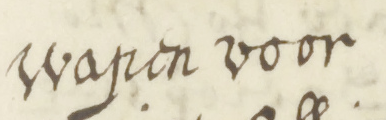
Wapen voor
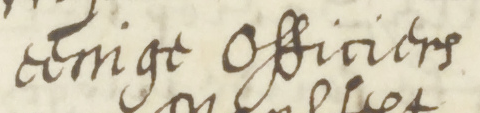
eenige officiers
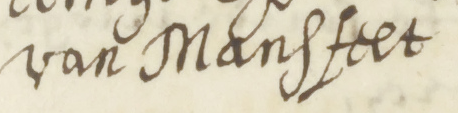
van Mansfelt
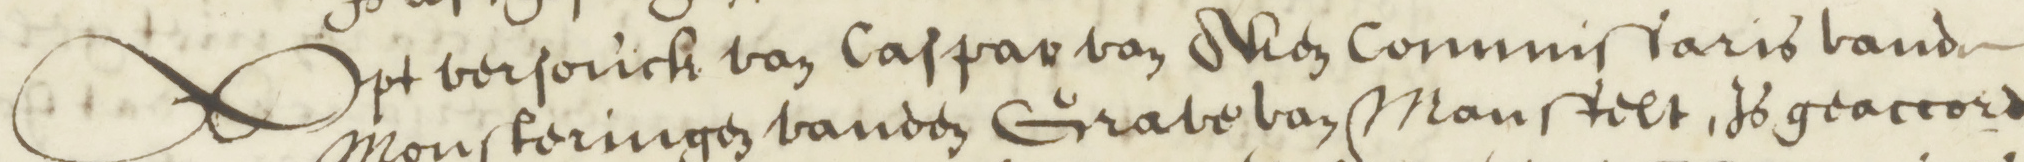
Opt versouck van Caspar van Aken commissaris vande
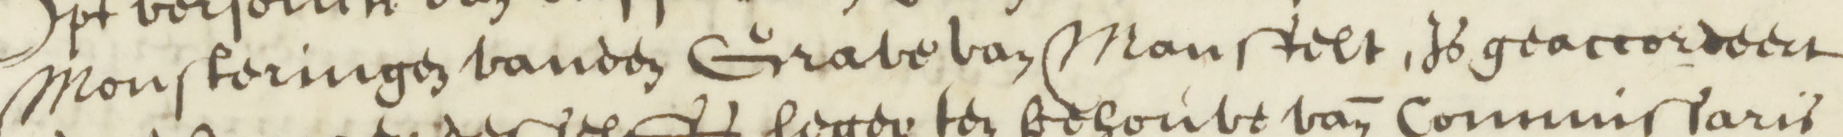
monsteringen vanden Grave van Mansfelt, Is geaccordeert
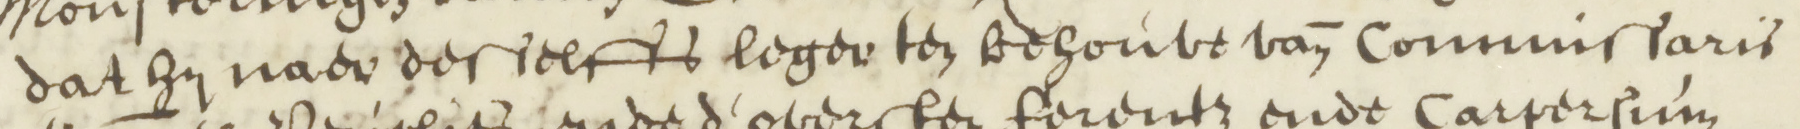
dat hy naer desselffs leger ten behouve van commissaris
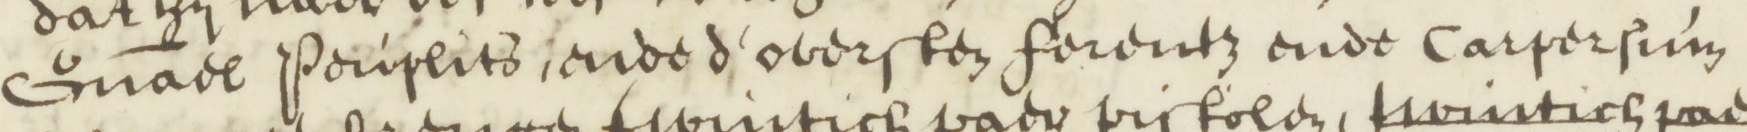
Gnael Peuplits, ende d'oversten Ferentz ende Carpersum
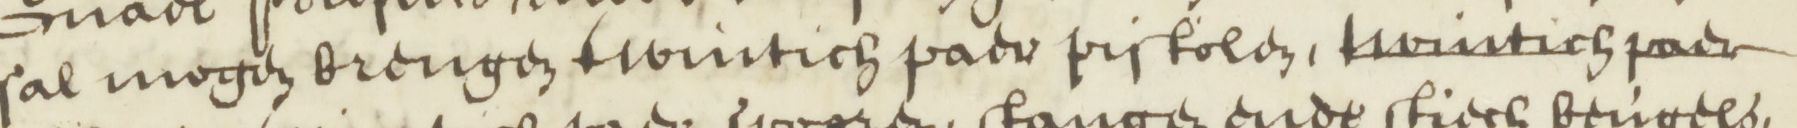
sal mogen brengen twintich paer pistolen, twintich paer
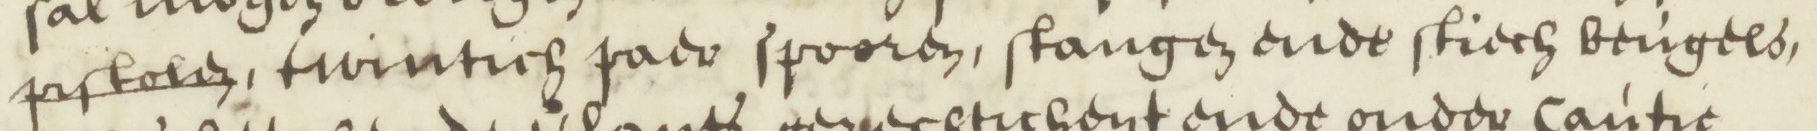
pistolen, twintich paer spooren, stangen ende stiech beugels,
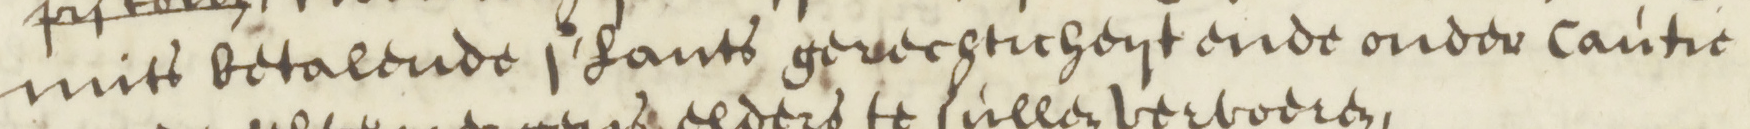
mits betalende s'Lants gerechticheyt ende onder cautie
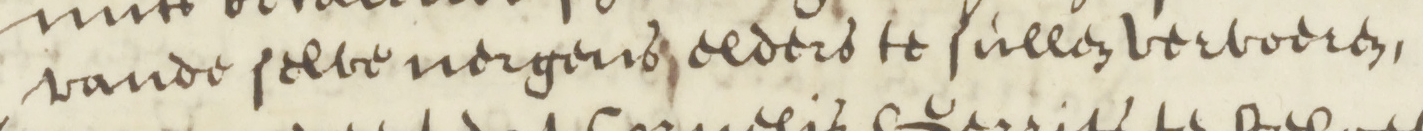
vande selve nergens elders te sullen vervoeren.
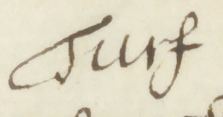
Turf
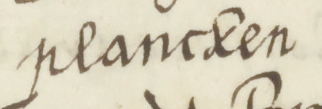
plancken
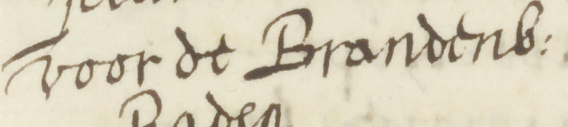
voor de Brandenb:
